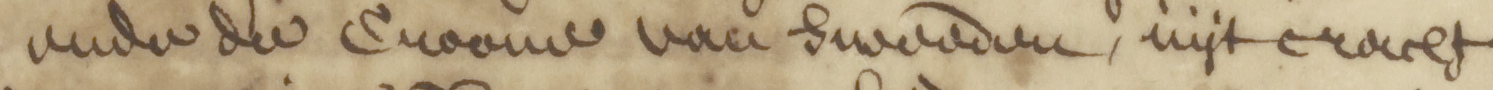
ende de Croone van Sweeden, uijt cracht
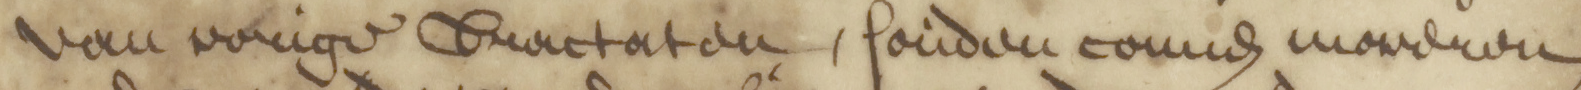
van vorige Tractaten, souden connen moveren,
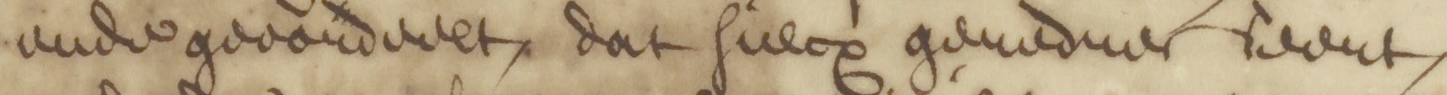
ende geoordeelt, dat sulcx geredresseert.
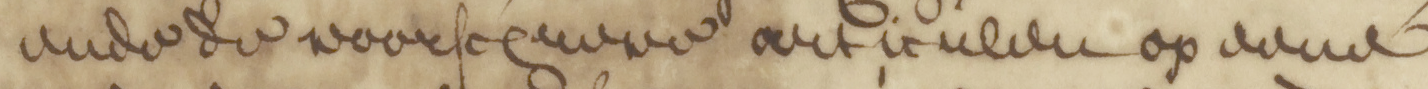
ende de voorschreve articulen op eene
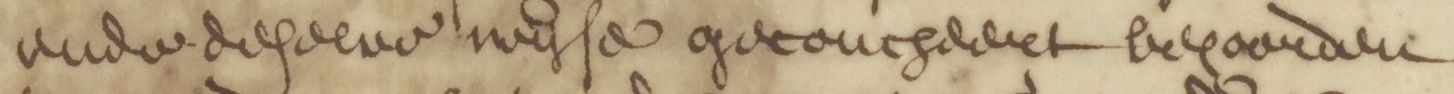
ende deselve wijse gecoucheert behoorden
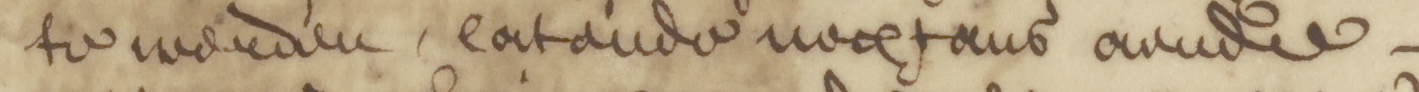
te werden, latende nochtans aende
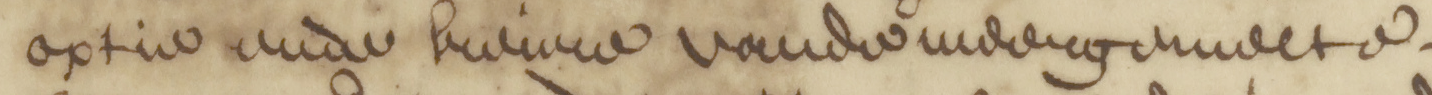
optie ende keure vande meergemelte
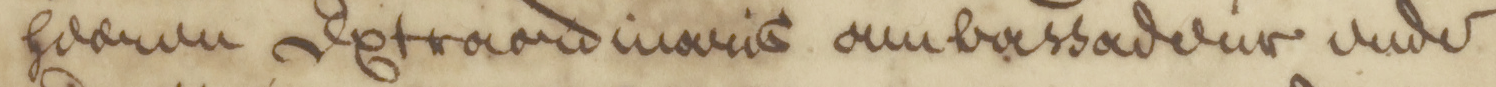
heeren Extraordinaris ambassadeur ende
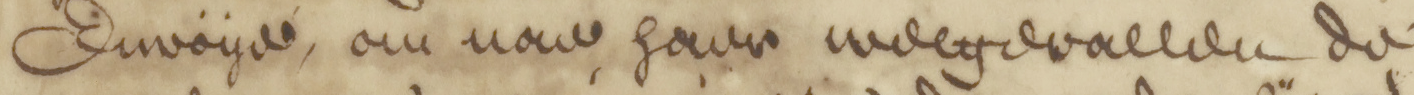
Envoijé, om nae haer welgevallen de
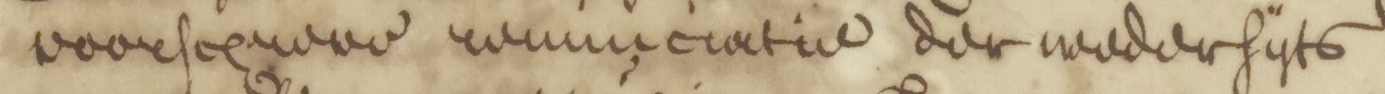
voorschreve renunciatie der wedersijts
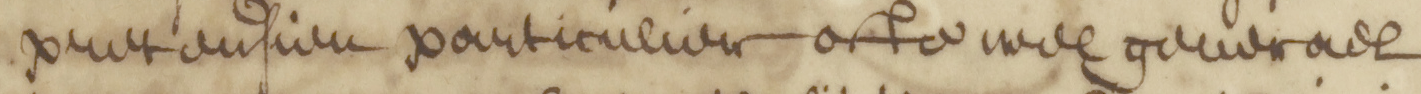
pretensien particulier ofte wel generael
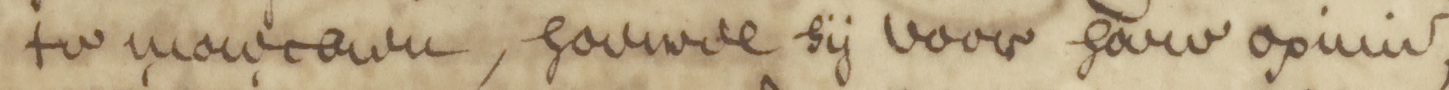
te maecken, hoewel sij voor hare opinie
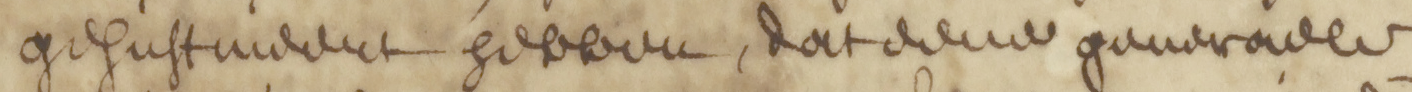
gesustineert hebben, dat eene generaele
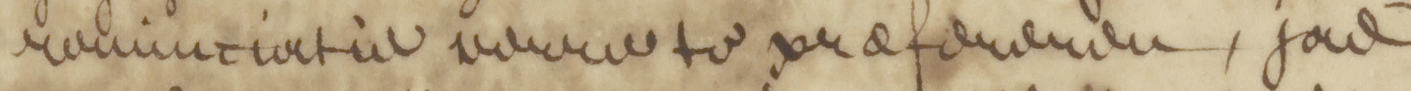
renunciatie verre te prefereren, jae
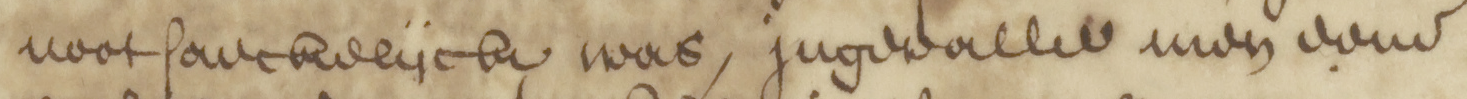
nootsaeckelijck was, ingevalle met eene
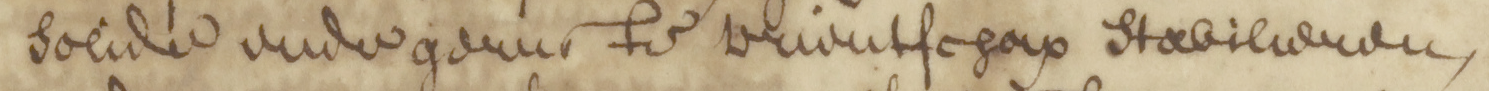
solide ende geruste vrientschap stabilieren,
